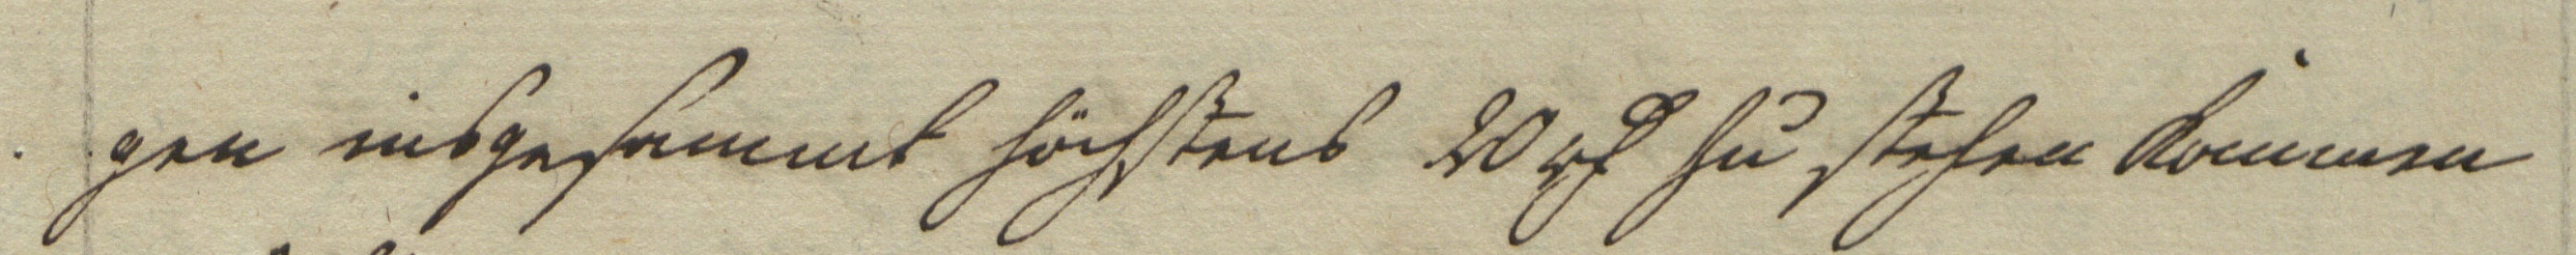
gen insgesammt höchstens 20 rth zu stehen kommen
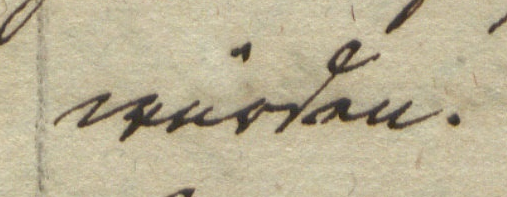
würden.
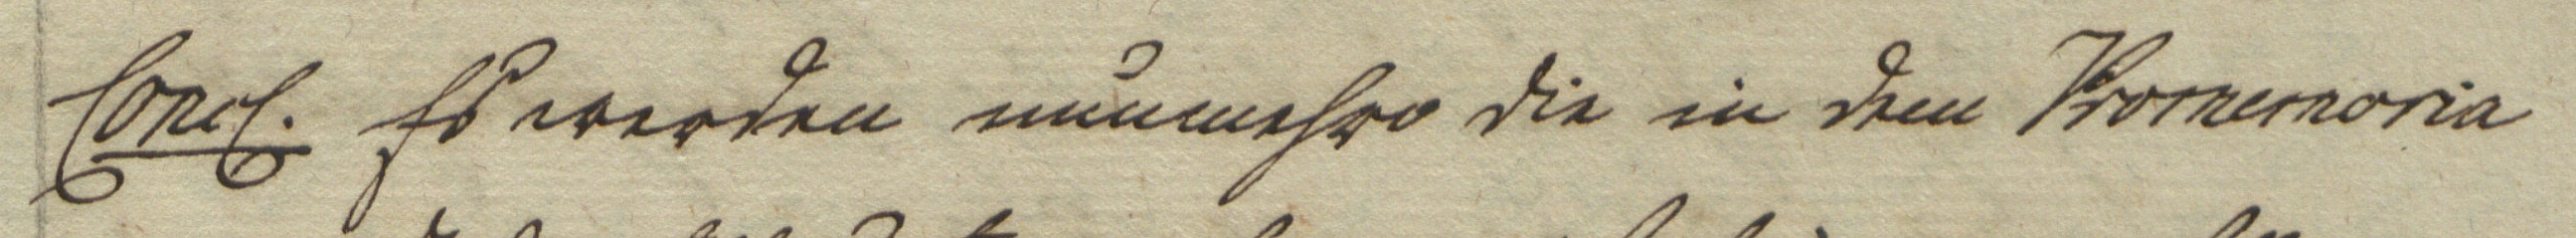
Concl. Es werden nunmehro die in dem Promemoria
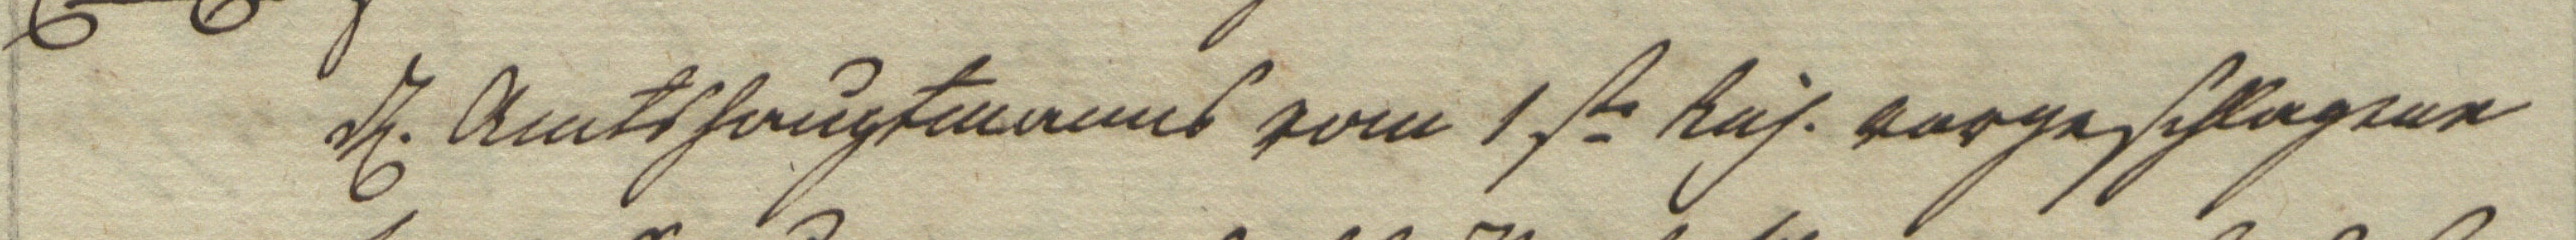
dh. Amtshauptmanns vom 1sten huj. vorgeschlagene
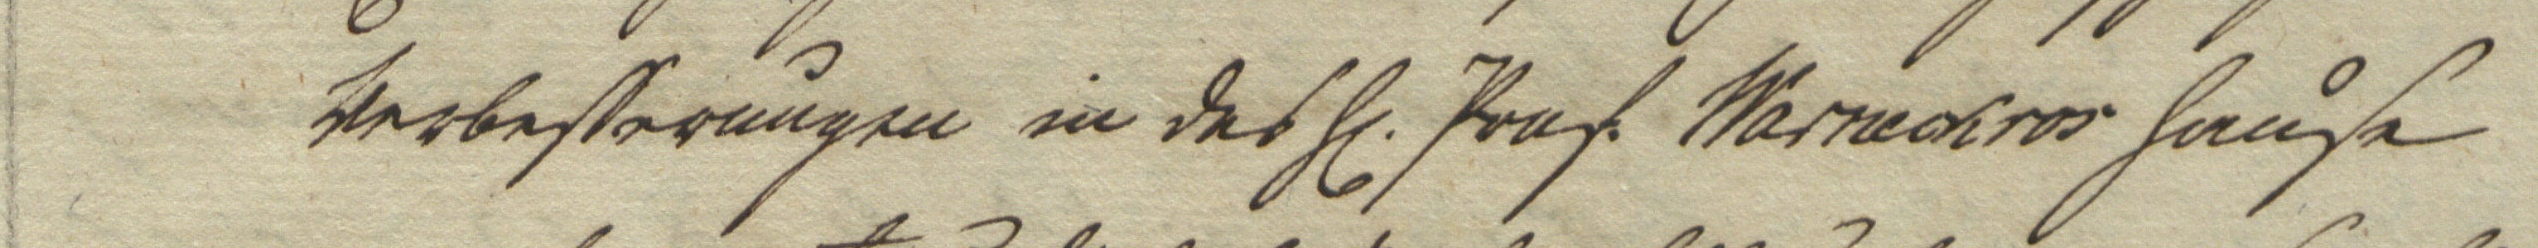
Verbesserungen in des H. Prof. Warneckros Hause
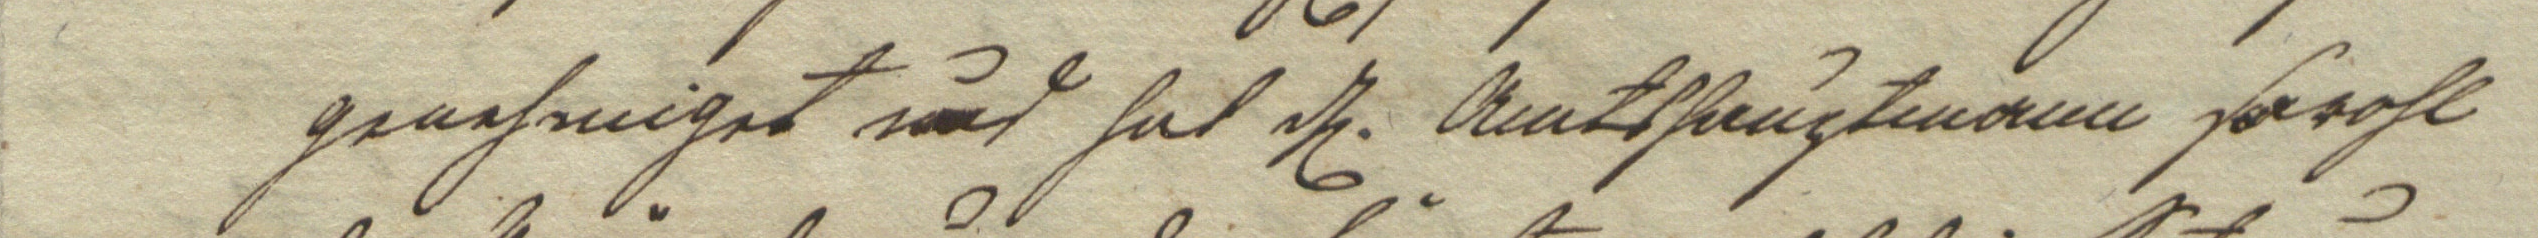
genehmiget und hat dh. Amtshauptmann sowohl
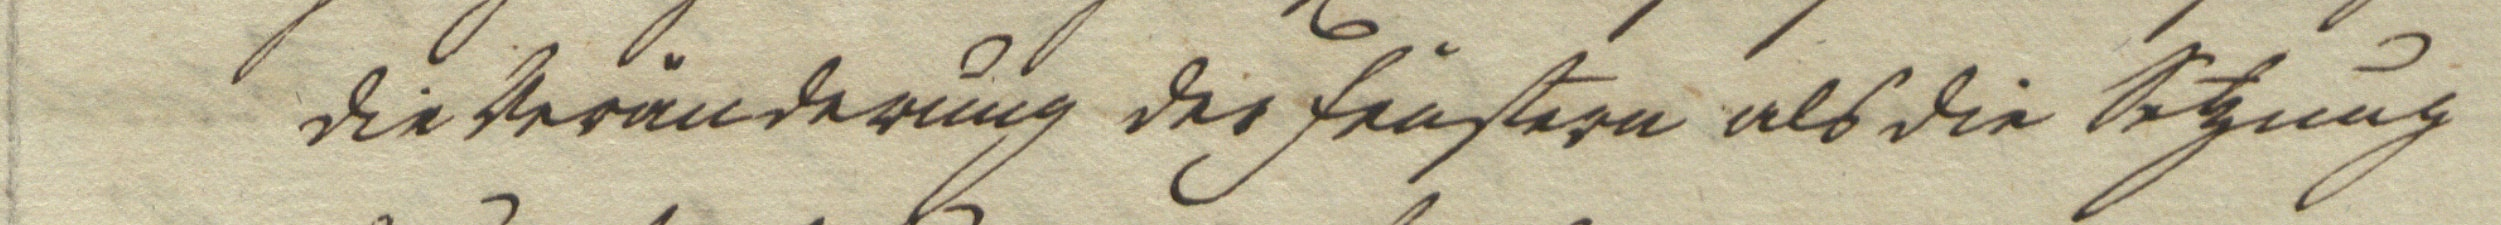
die Veränderung der Fenstern als die Setzung
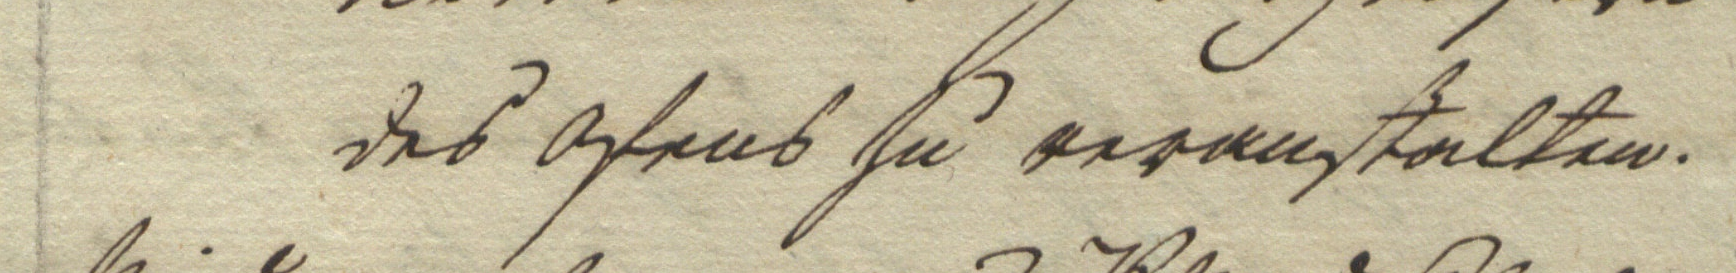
des Ofens zu veranstalten.
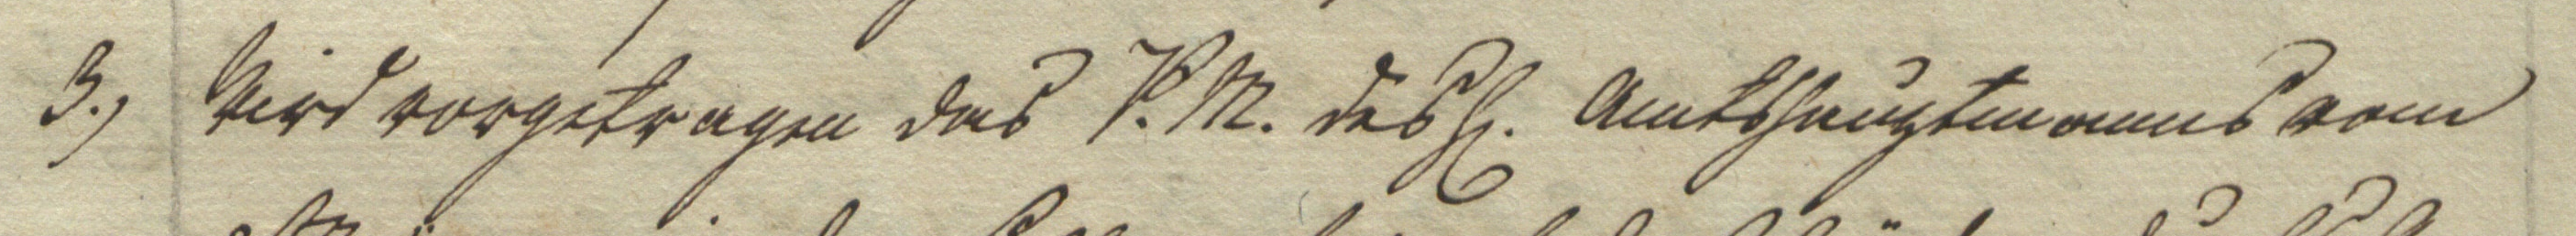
3., Wird vorgetragen das P. M. des H. Amtshauptmanns vom
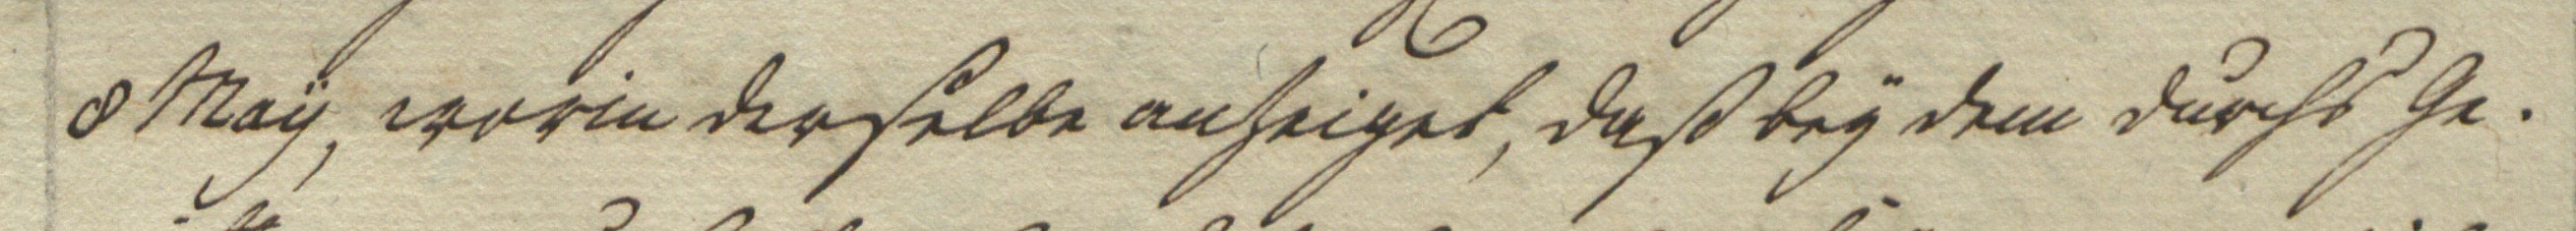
8 May, worin derselbe anzeiget, daß bey dem durchs Ge¬
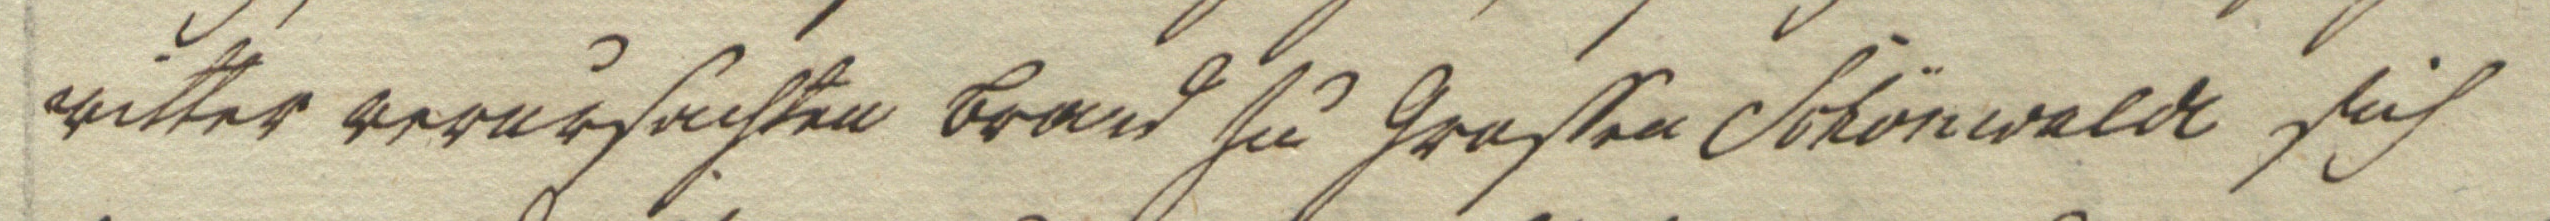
witter verursachten Brand zu Grossen Schönwalde sich
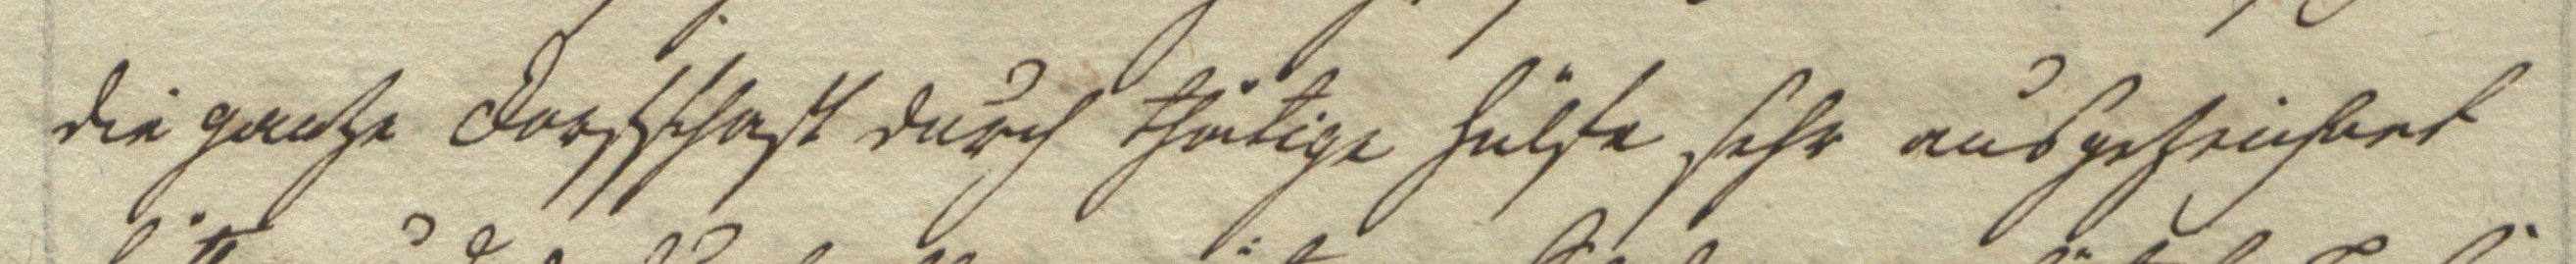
die ganze Dorfschaft durch thätige Hülfe sehr ausgezeichnet
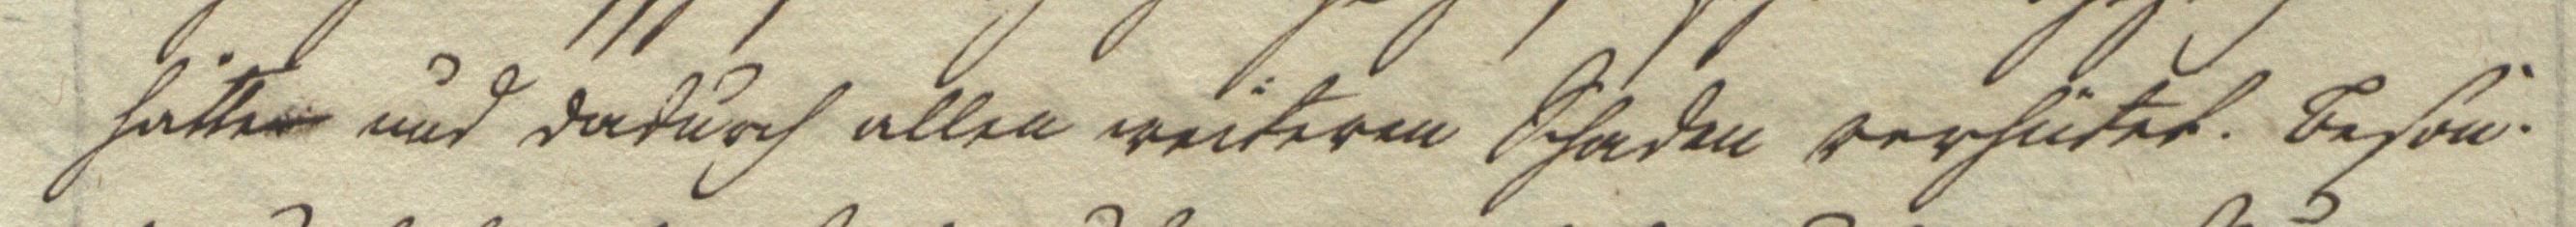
hätte und dadurch allen weiteren Schaden verhütet. Beson¬
